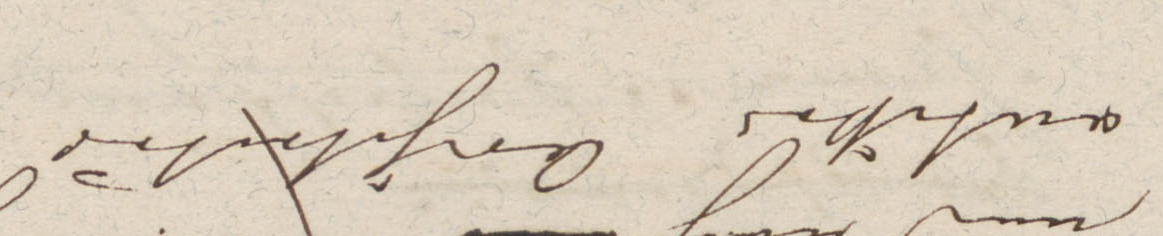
Die keine steinerne Bekleidung
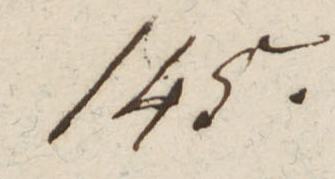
145.
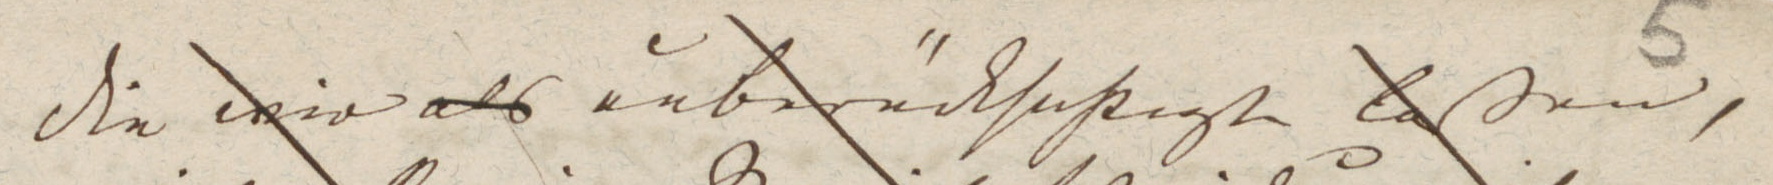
die wir als unberücksichtigt lassen,
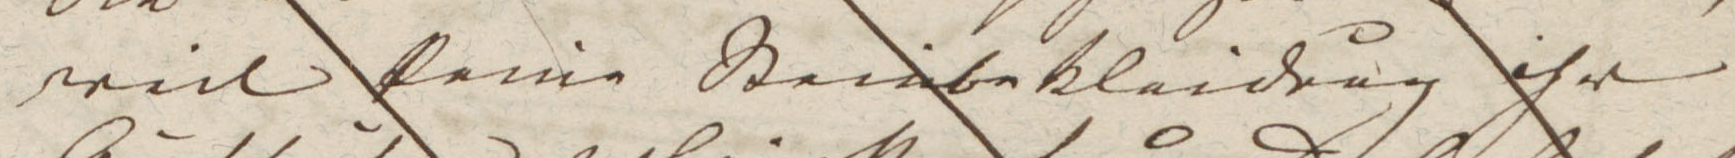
weil keine Steinbekleidung ihr
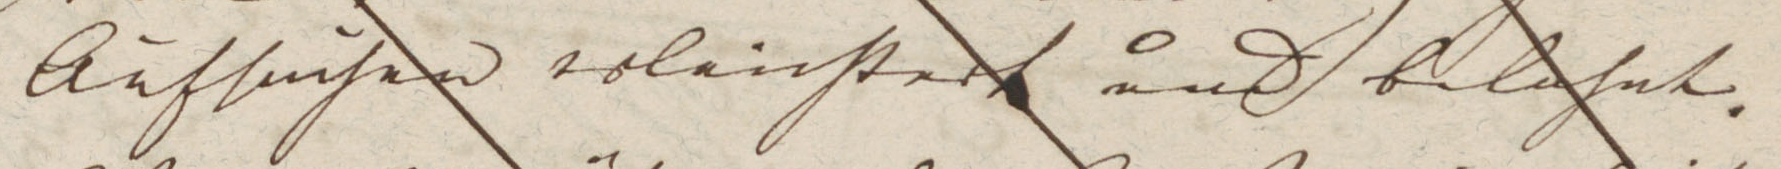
Aufsuchen erleichtert und belohnt.
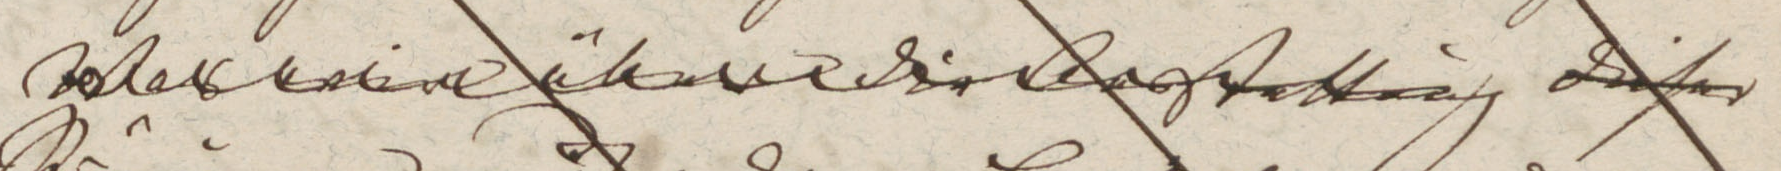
Was wir über die Ausstattung dieser
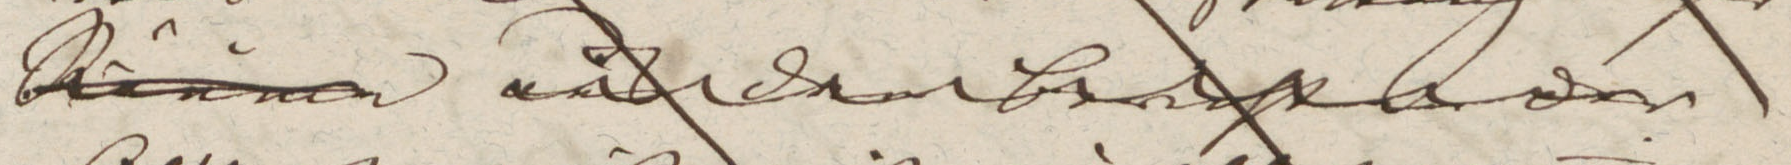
Räume aus dem Berichte der
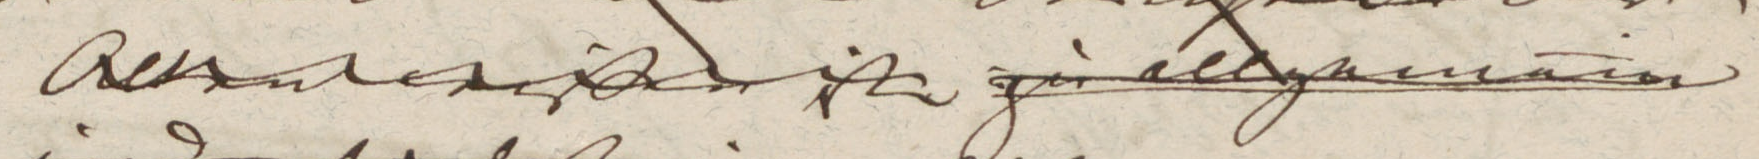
Alten wissen ist zu allgemein
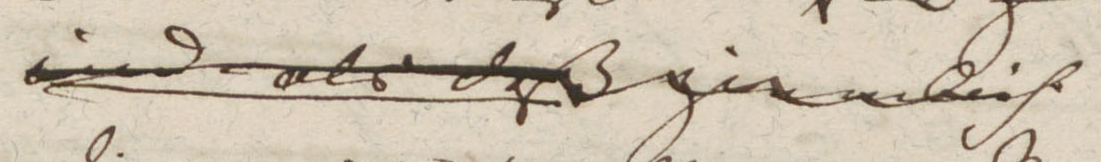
und als dass ziemlich
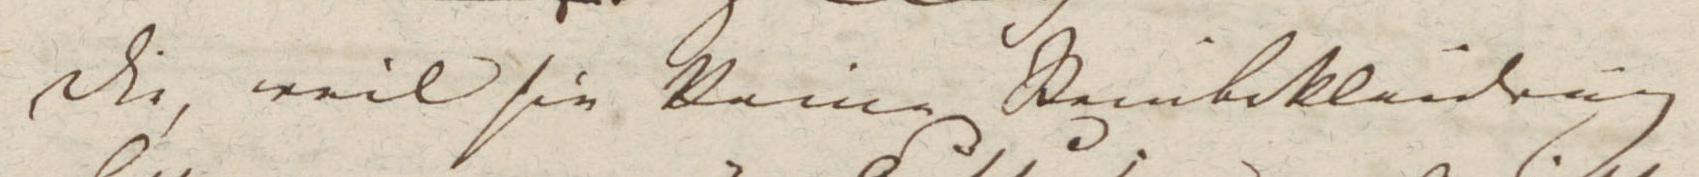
Die, weil sie keine Steinbekleidung
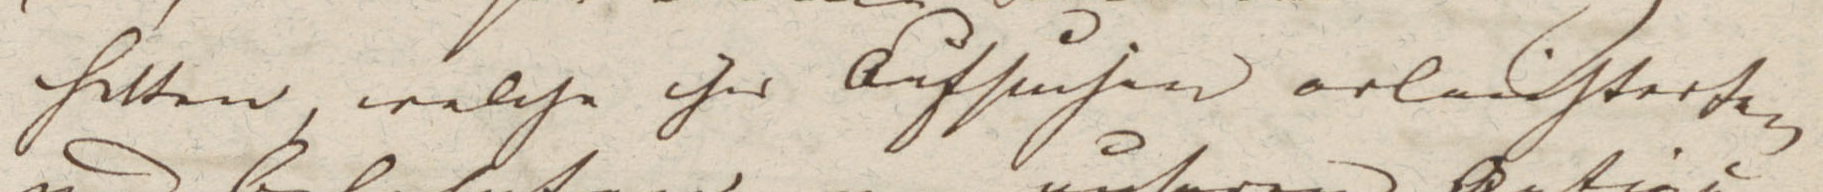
hatten, welche ihr Aufsuchen erleichterten
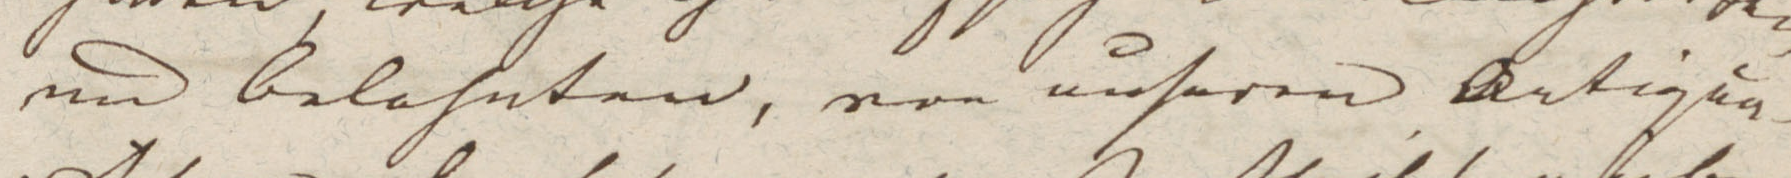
und belohnten, von unseren Antiqua-
